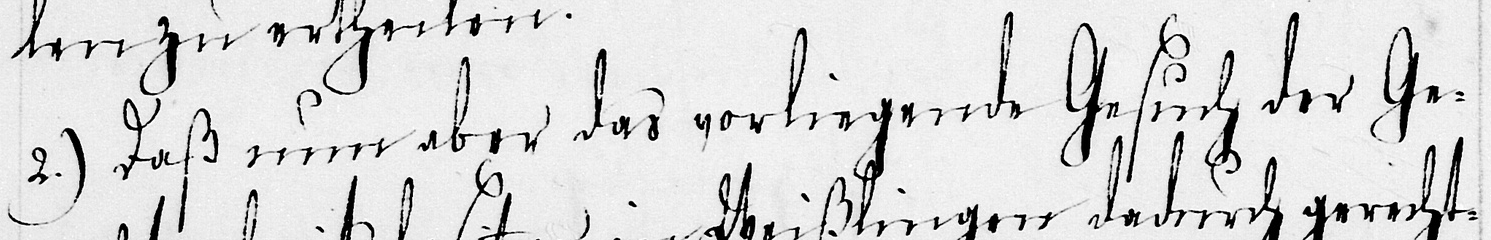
2.) Daß nun aber das vorliegende Gesuch der Ge¬
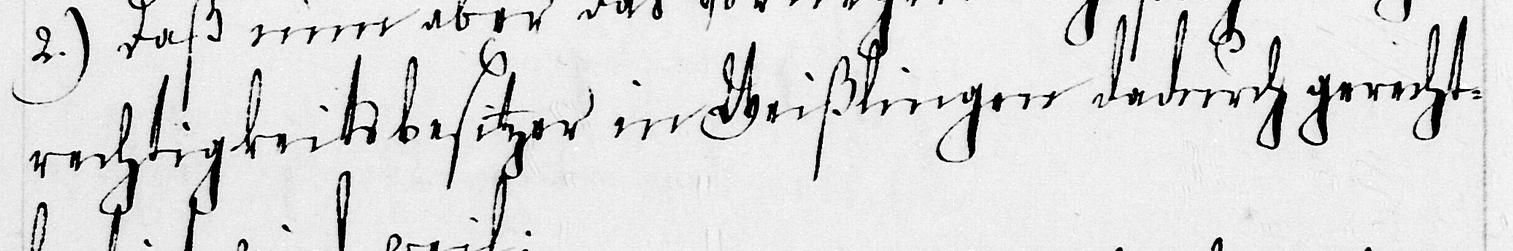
rechtigkeitsbesitzer in Weißlingen dadurch gerecht¬
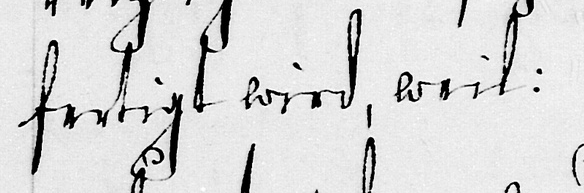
fertigt wird, weil:
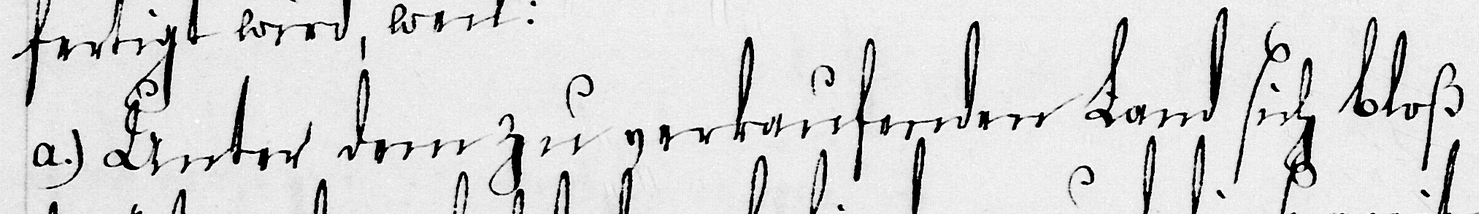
a.) Unter dem zu verkaufenden Land sich bloß
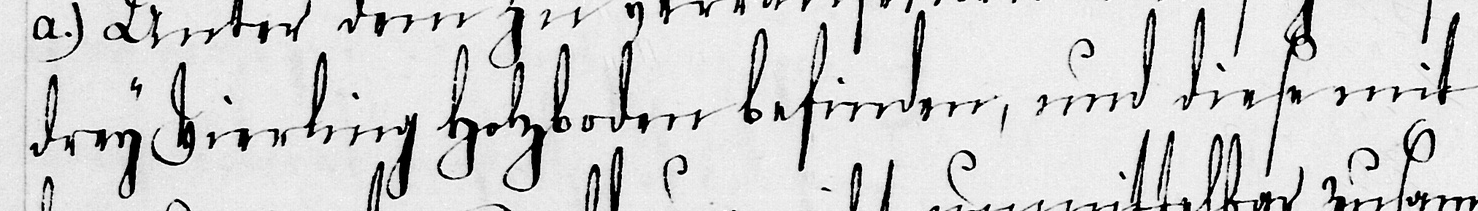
drey Vierling Holzboden befinden, und diese mit
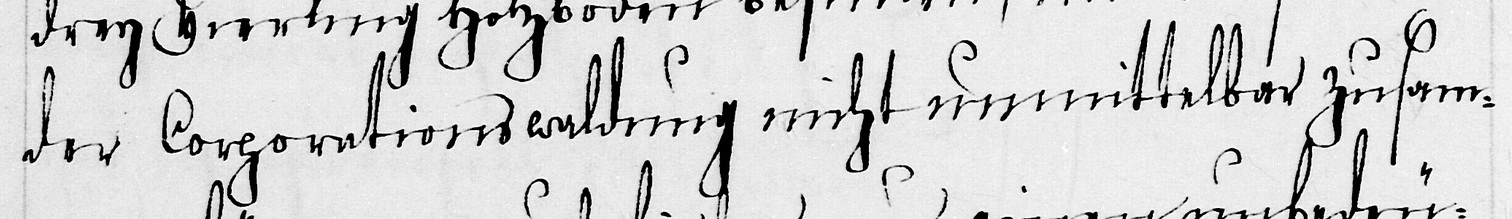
der Corporationswaldung nicht unmittelbar zusam¬
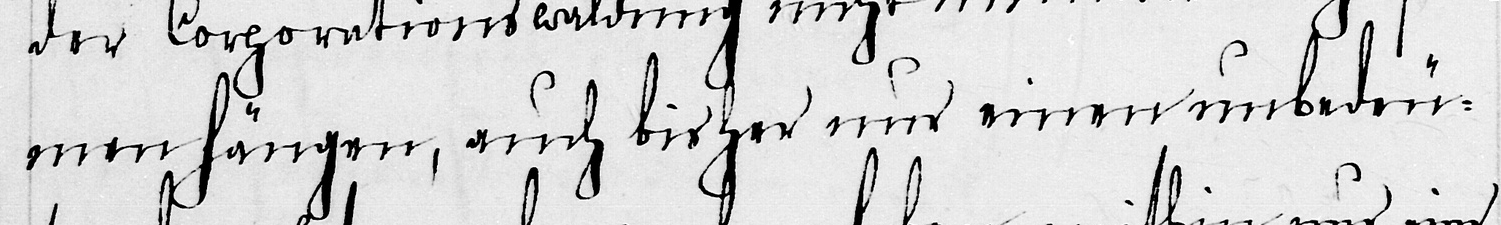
menhängen, auch bisher nur einen unbedeu¬
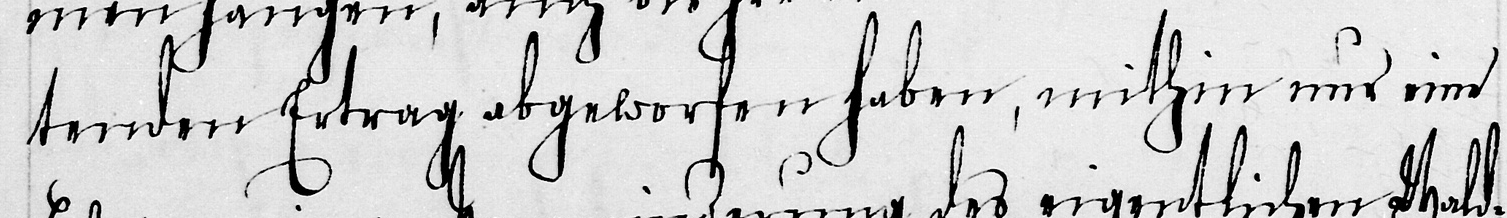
tenden Ertrag abgeworfen haben, mithin nur eine
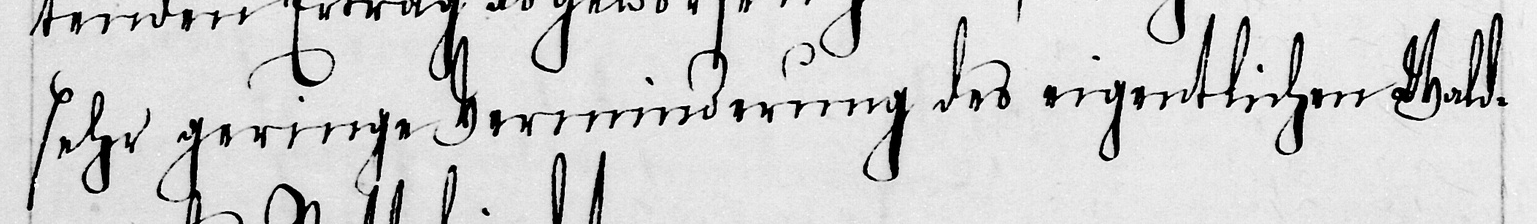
sehr geringe Verminderung des eigentlichen Wald¬
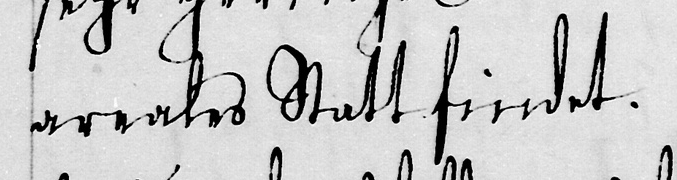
areales Statt findet.
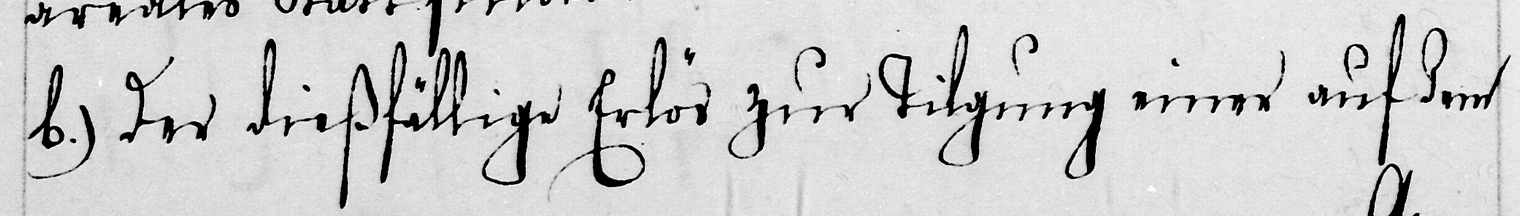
b.) Der dießfällige Erlös zur Tilgung einer auf dem
